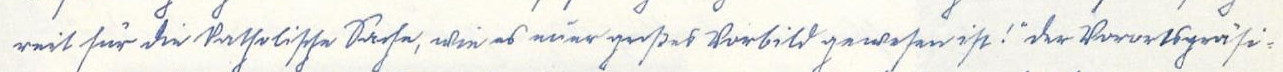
reit für die katholische Sache, wie es euer großes Vorbild gewesen ist!“ Der Vorortspräsi-
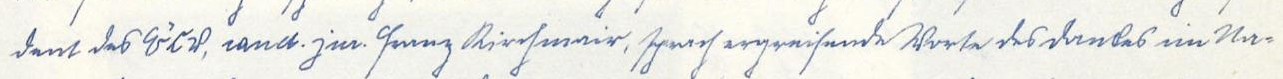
dent des ÖCV Franz Kirchmayr, sprach ergreifende Worte des Dankes im Na-
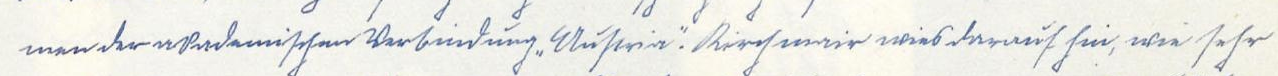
men der akademischen Verbindung „Austria“. Kirchmair wies darauf hin, wie sehr
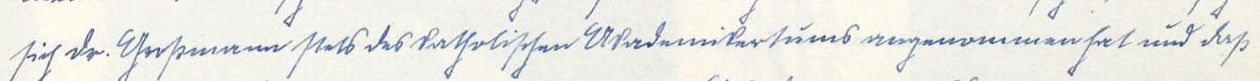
Dr. Großmann steht des katholischen Akademikertums angenommen hat und daß
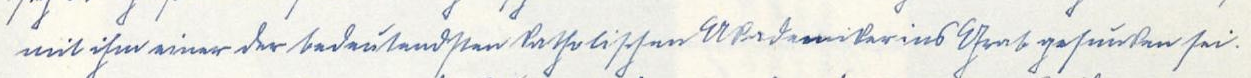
mit ihm einer der bedeutendsten katholischen Akademiker ins Grab gesunken sei.
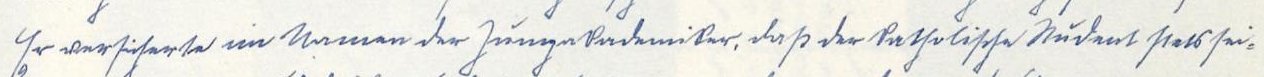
Er versicherte im Namen der Jungakademiker, daß der katholische Student stets sei-
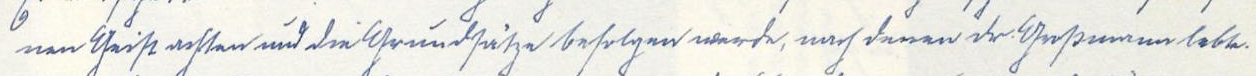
nen Geist achten und die Grundsätze befolgen werde, nach denen Dr. Großmann lebte.
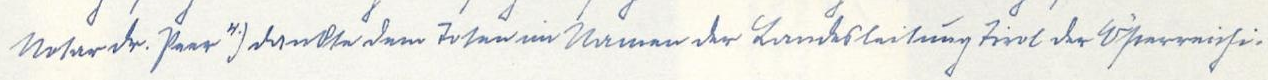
Notar Dr. Peer dankte dem Toten im Namen des Landesleitung Tirol der Österreichi-
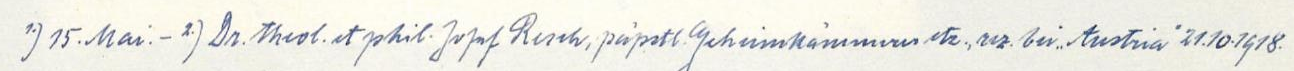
1) 15. Mai. – 2) Dr. theol. et phil. Josef Resch, päpstl. Geheimkämmerer ck (?), rez. bei „Austria“ 21.10.1918.
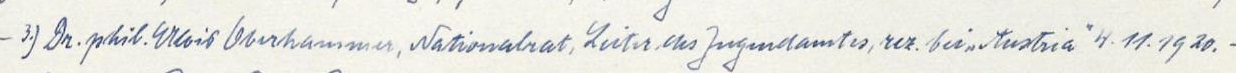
3) Dr. phil. Alois Oberhammer Nationalrat, Leiter des Jugendamtes, rez. bei „Austria“ 4.11.1920.-
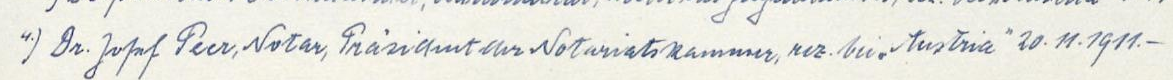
4) Dr. Josef Peer, Notar, Präsident der Notariatskammer, rez. bei „Austria“, 20.11.1911.-
